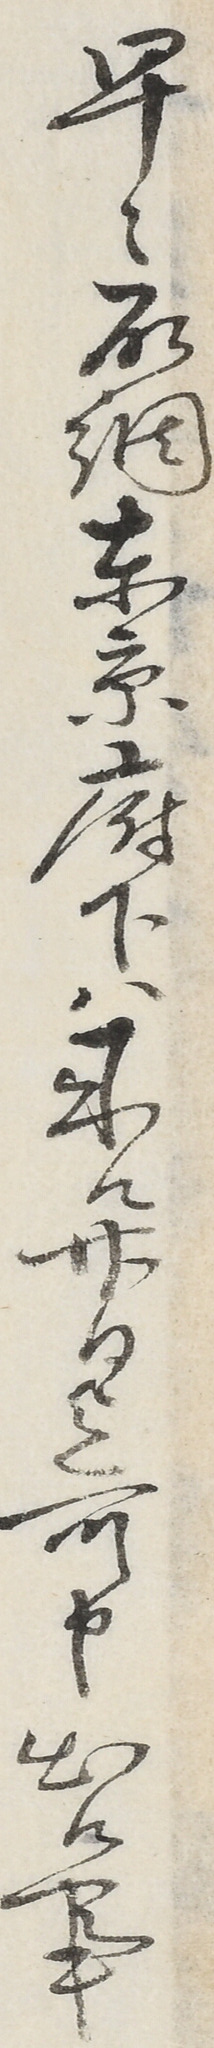早々取調東京府下ハ来ル廿日迄可申出候出ル事
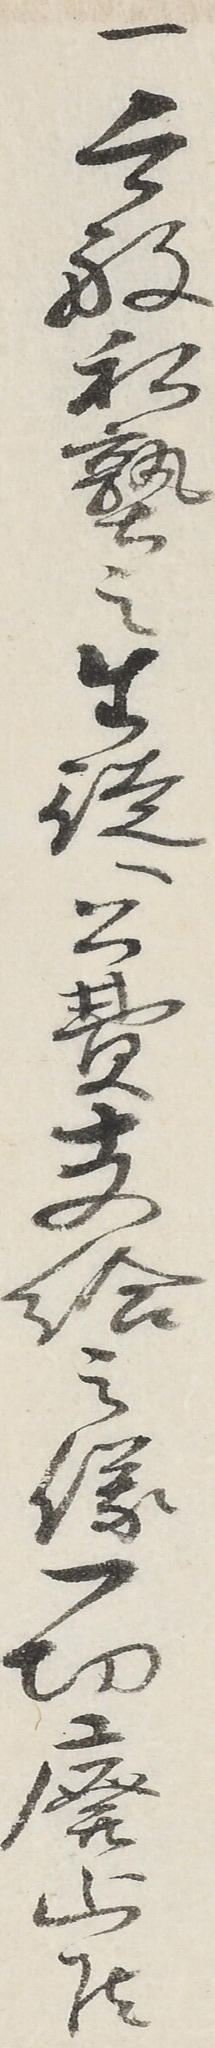一今般私塾之生徒へ公費支給之儀一切廃止候
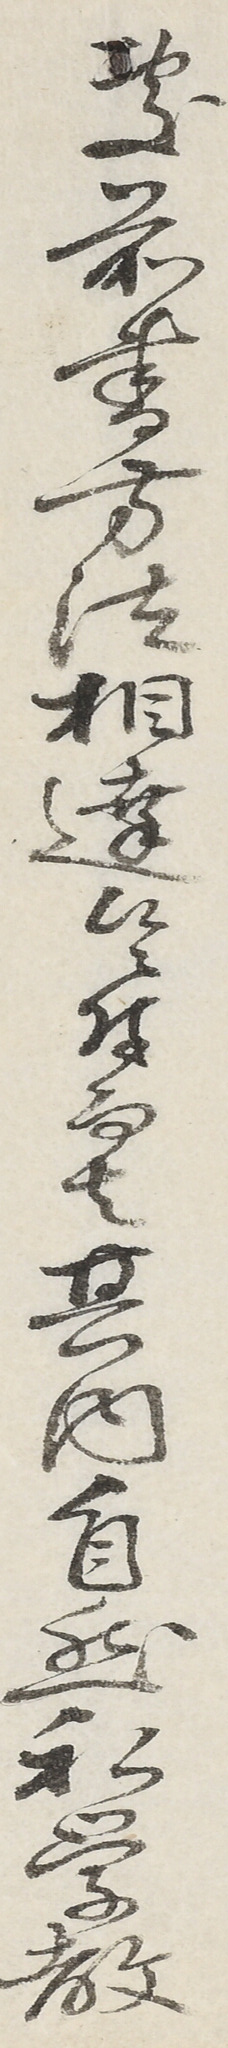処前書方法相達候ニ付而は其内自然私学教
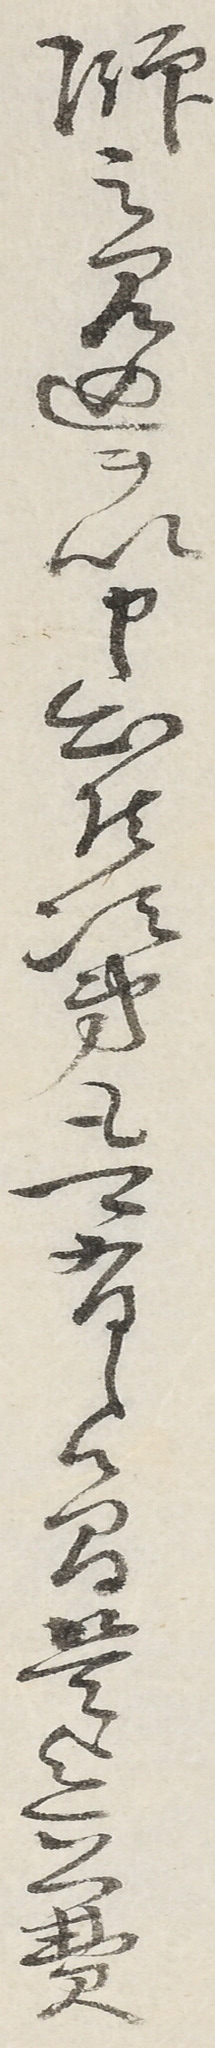師之見込ヲ以申出候次第も可有之候間是迄公費
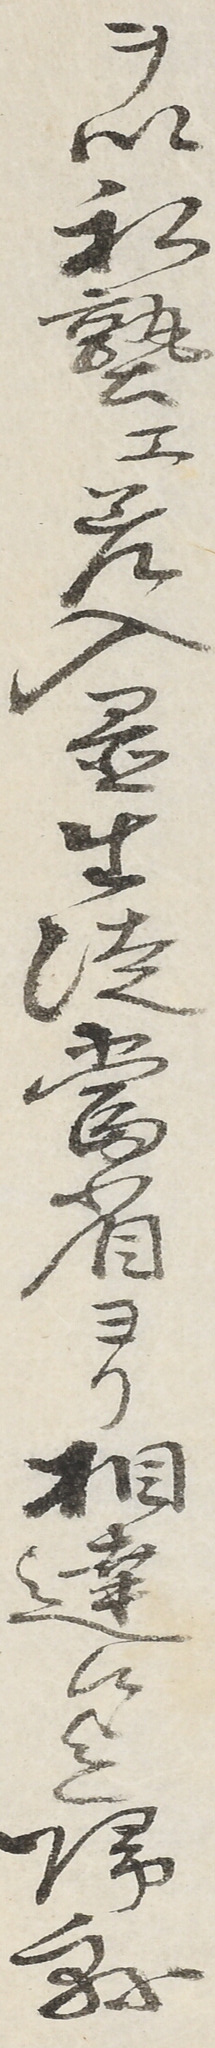ヲ以私塾エ差入置生徒当省ヨリ相達候迄帰県
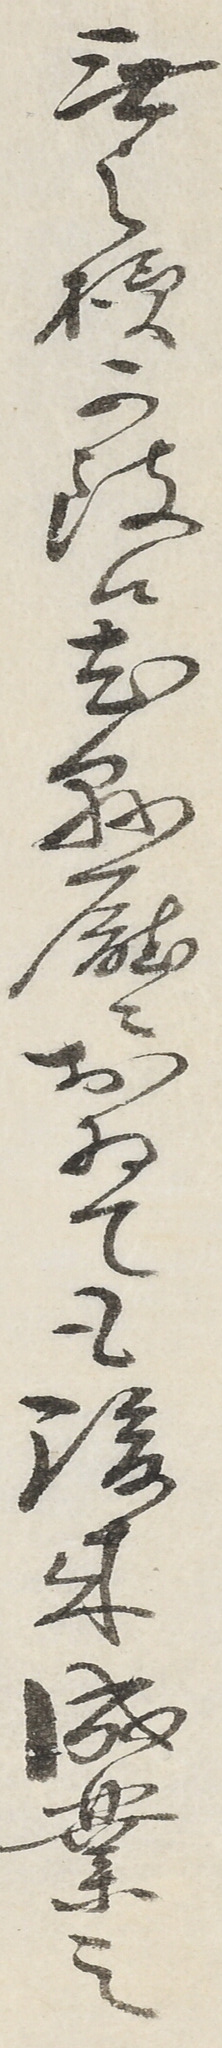無之様可致候尤県庁ニおゐても後来成業之
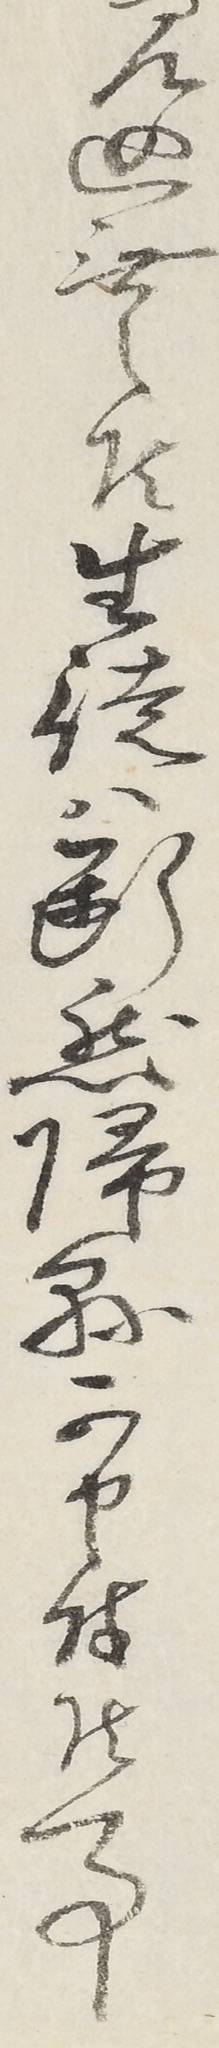見込無之候生徒ハ断然帰県可申付候事
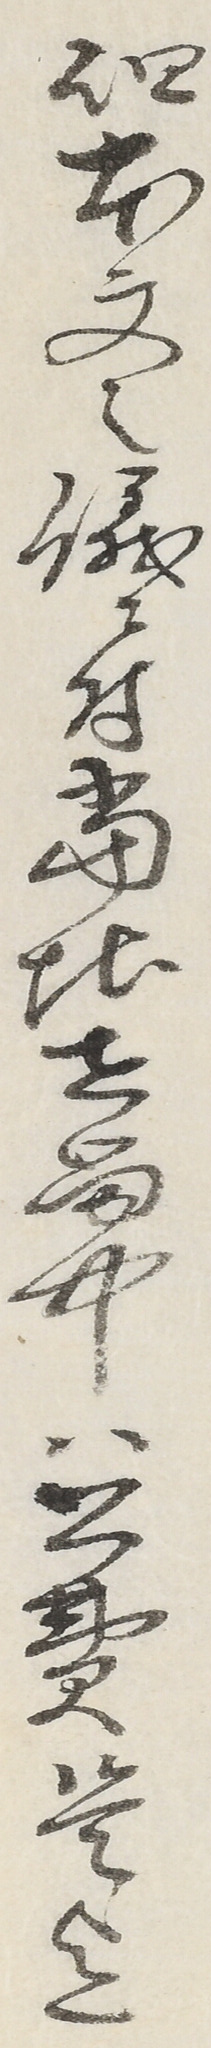但本文之儀ニ付当地を留中ハ公費是迄
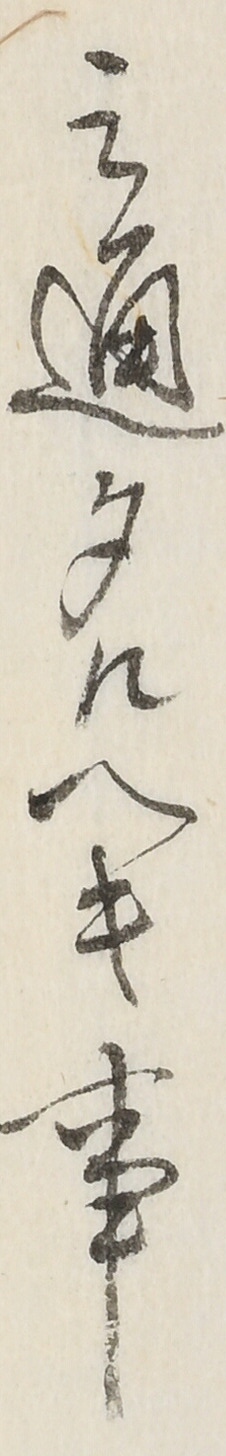之通タルヘキ事
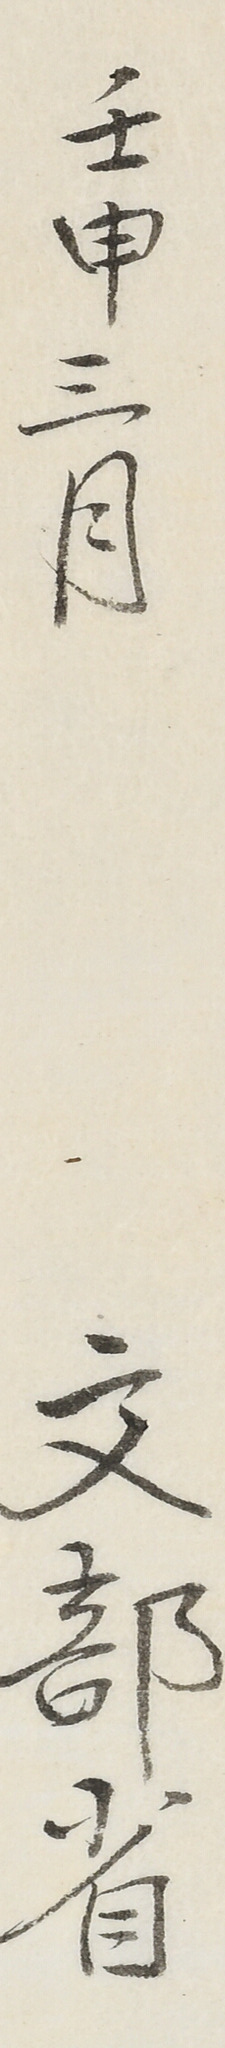壬申三月文部省
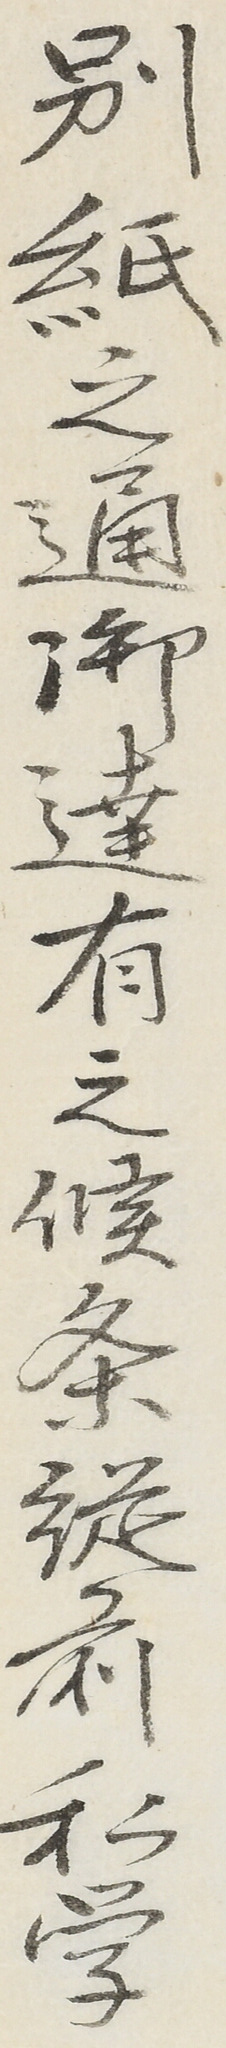別紙之通御達有之候条縦前私学
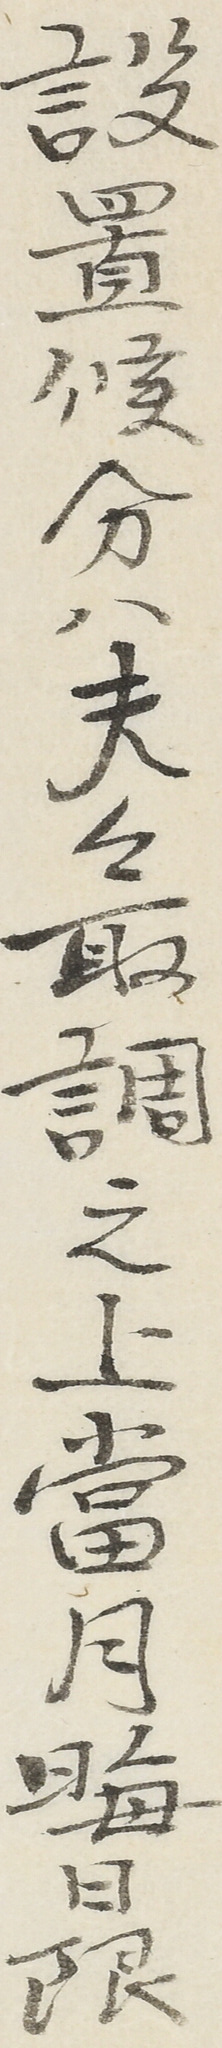設置候分ハ夫々取調之上当月晦日限
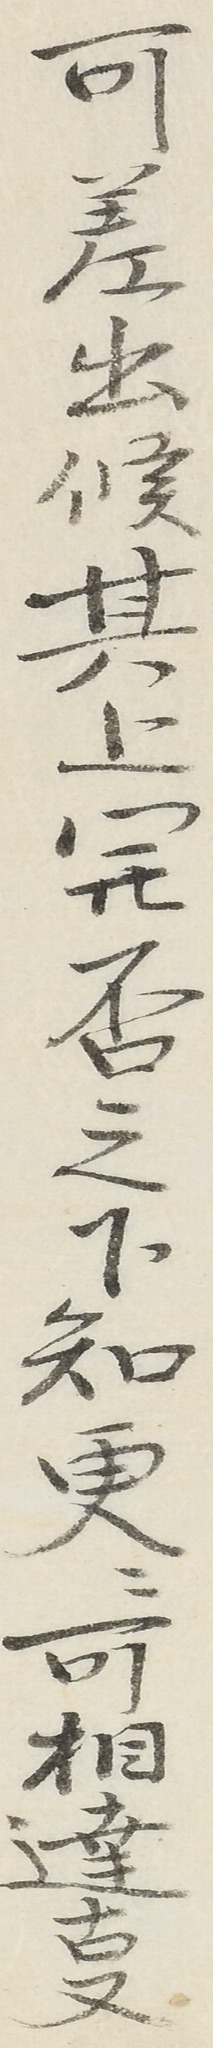可差出候其上開否之下知更ニ可相達事
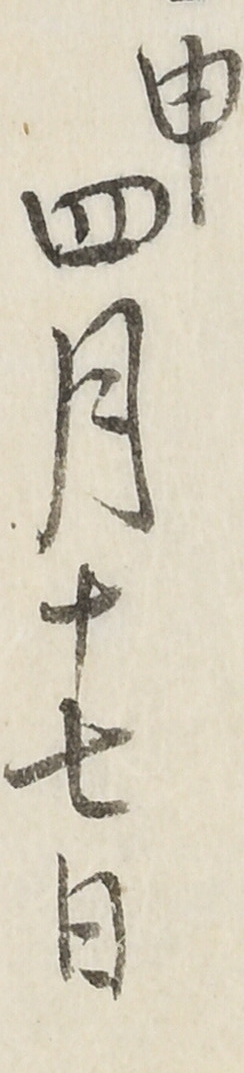四月十七日
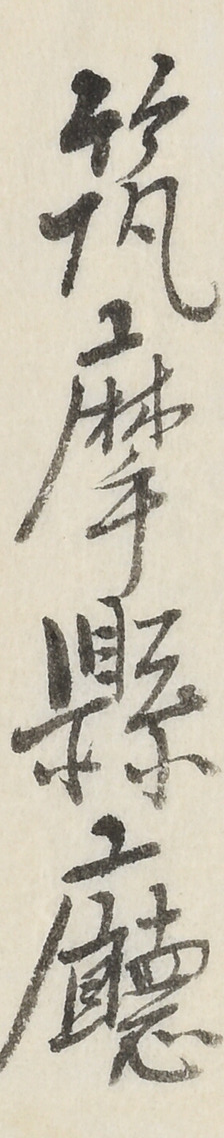筑摩県庁

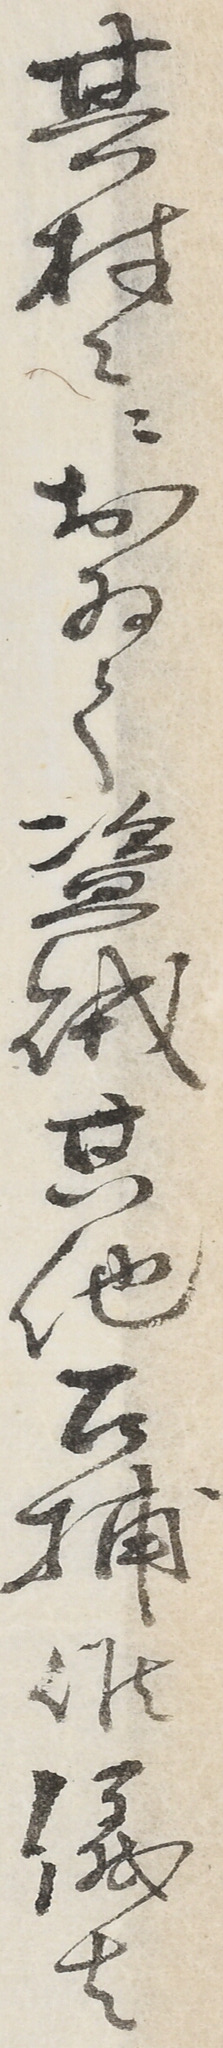其村々ニおゐて盗賊其他召捕候儀は
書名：廻状（控）
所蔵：伊那市立高遠町図書館・合同会社AMANE
